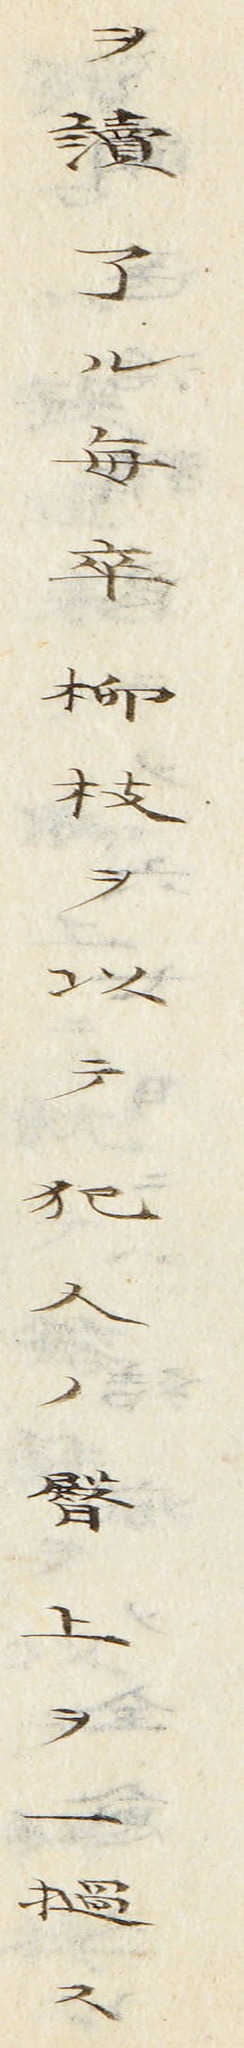ヲ読了ル毎卒柳杖ヲ以テ犯人ノ臀上ヲ一撾ス
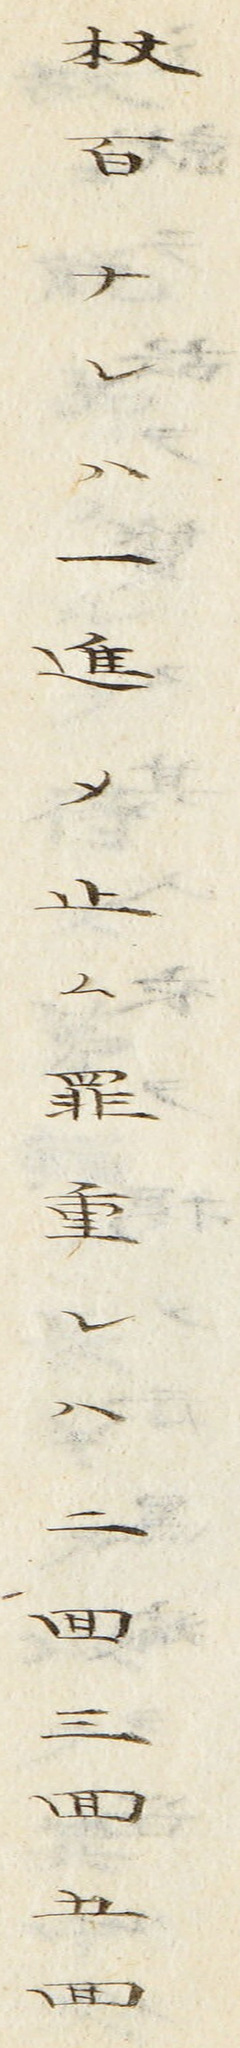杖百ナレハ一進シテ止ム罪重レハ二回三回五回
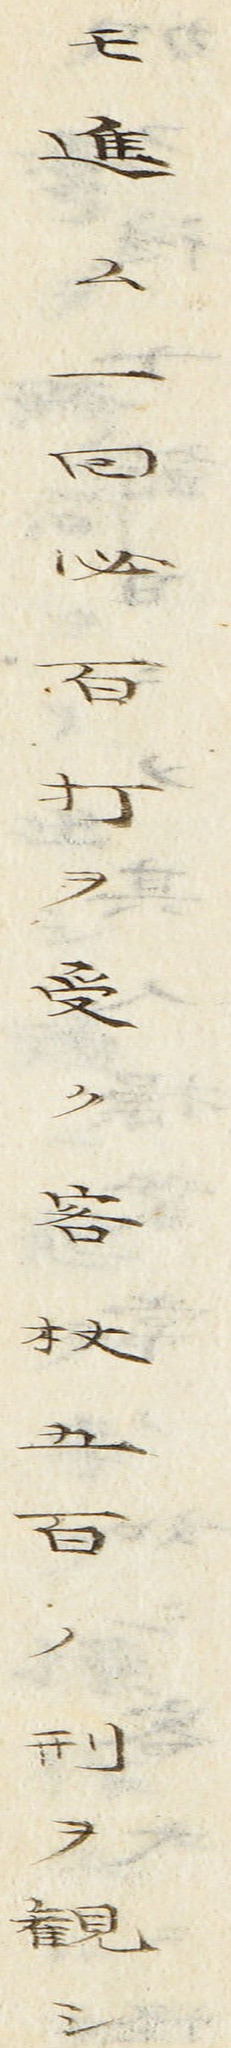モ進ム一回必百打ヲ受ク客杖五百ノ刑ヲ観シ
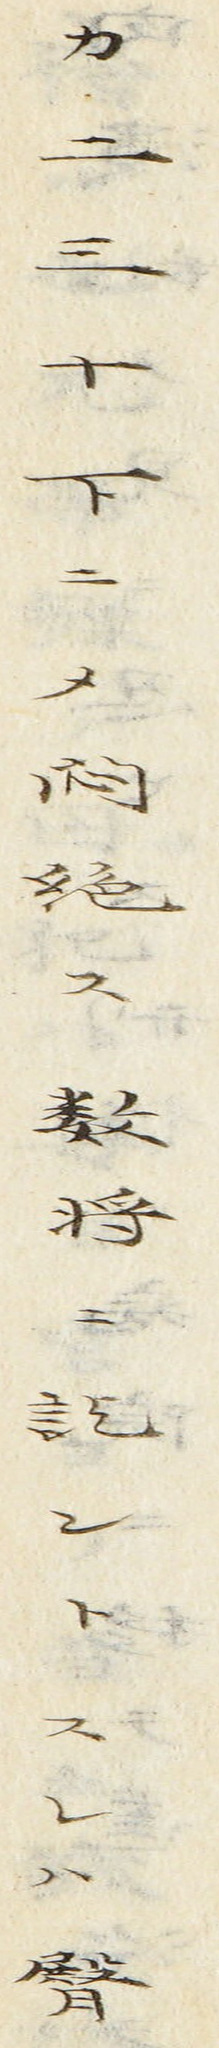カニ三十下ニシテ悶絶ス数将ニントスレハ臀

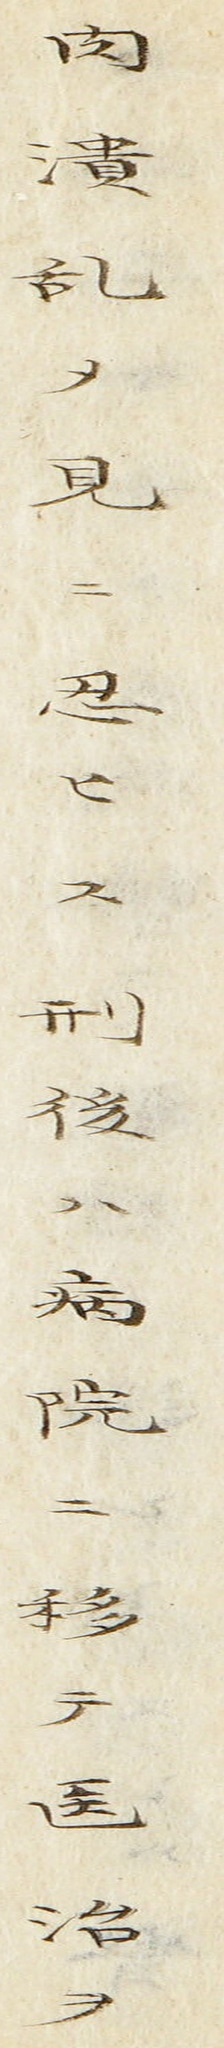肉潰乱シテ見ニ忍ヒス刑後ハ病院ニ移テ医治ヲ
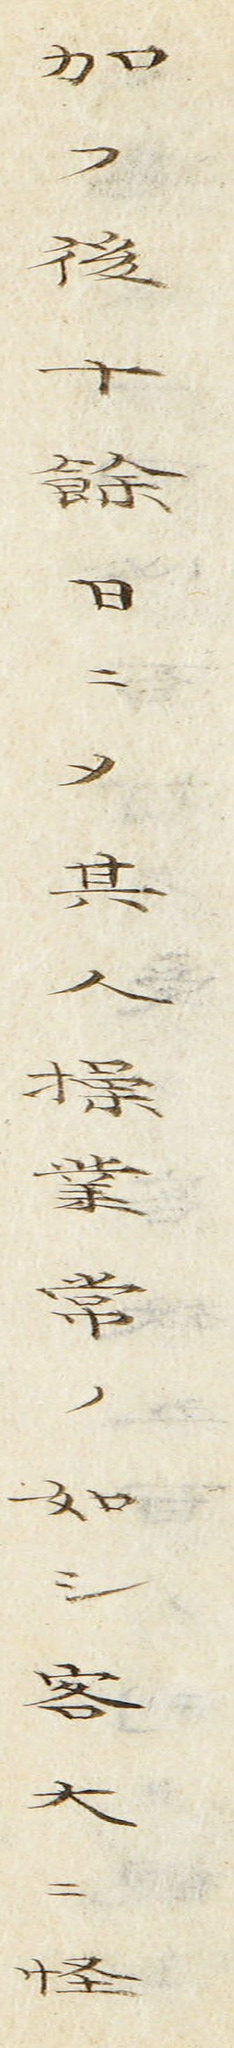加フ後十余日ニシテ其人操業常ノ如シ客大ニ怪
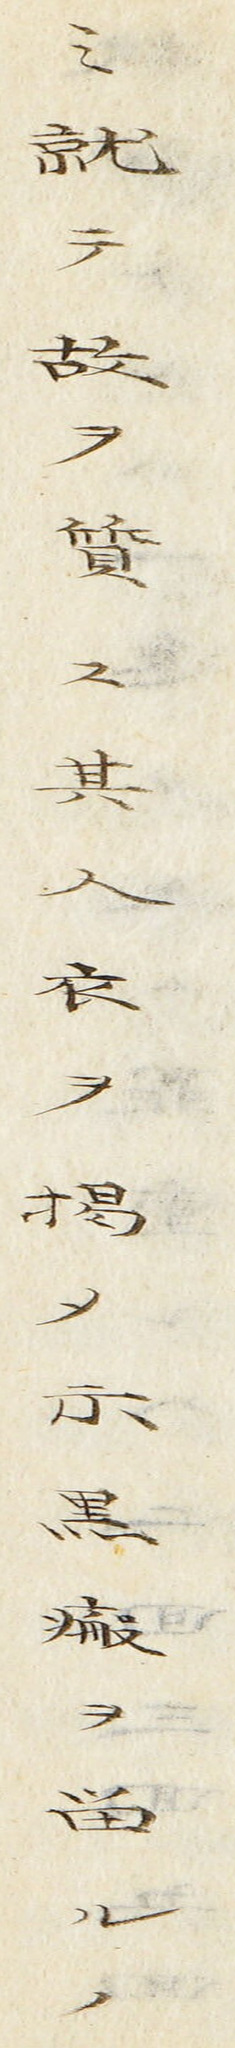ミ就テ故ヲ質ス其人衣ヲ掲シテ示黒瘢ヲ留ルノ
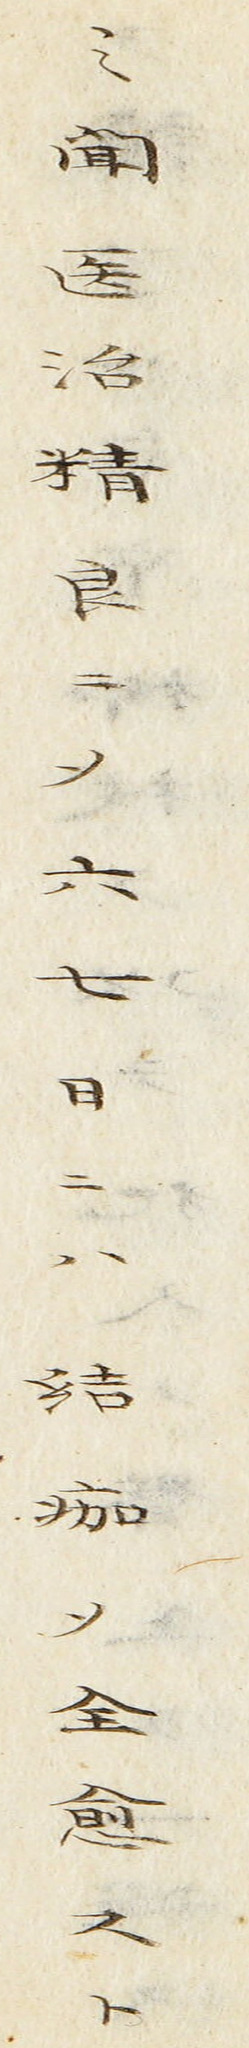ミ聞医治精良ニシテ六七日ニハ結痂シテ全愈スト
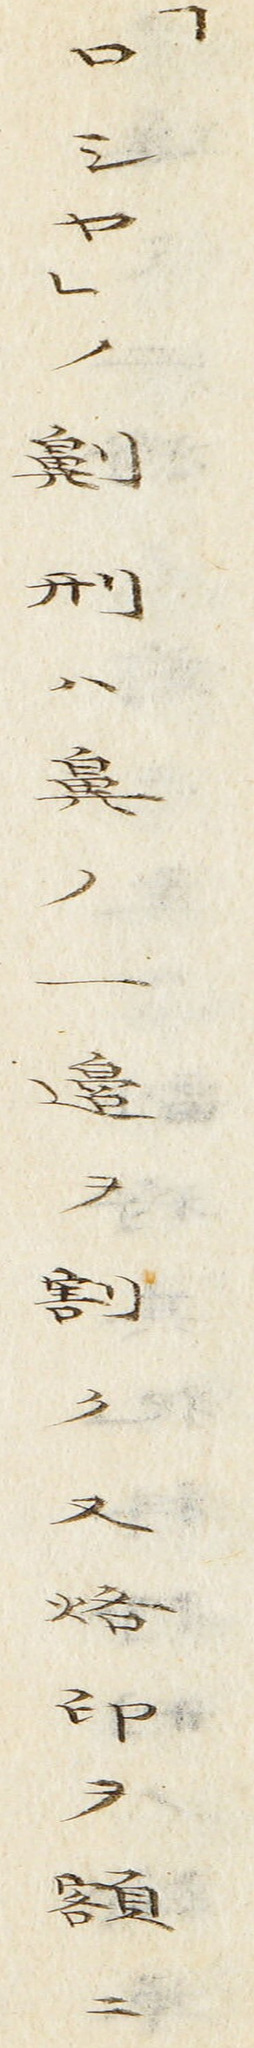〇「ロシヤ」ノ劓刑ハ鼻ノ一辺ヲ割クま又烙印ヲ額ニ
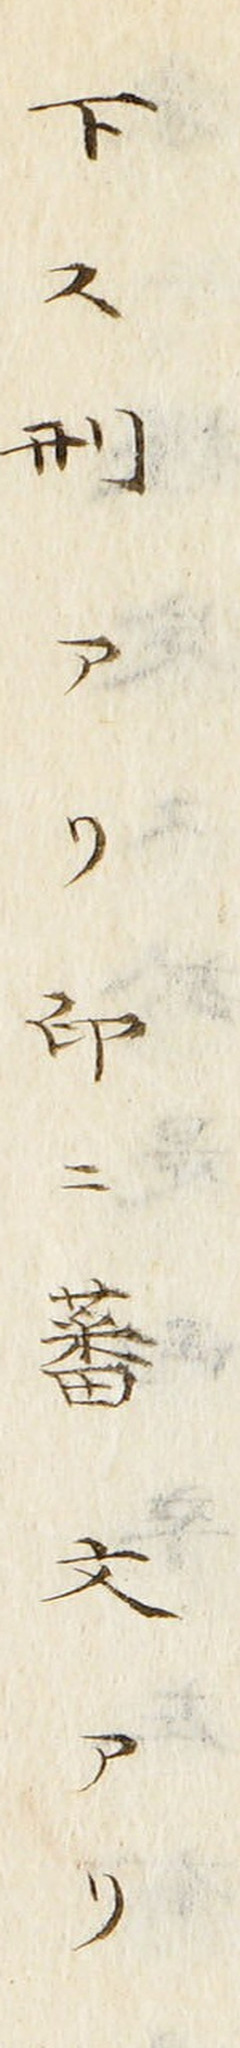下ス刑アリ印ニ蕃文アリ
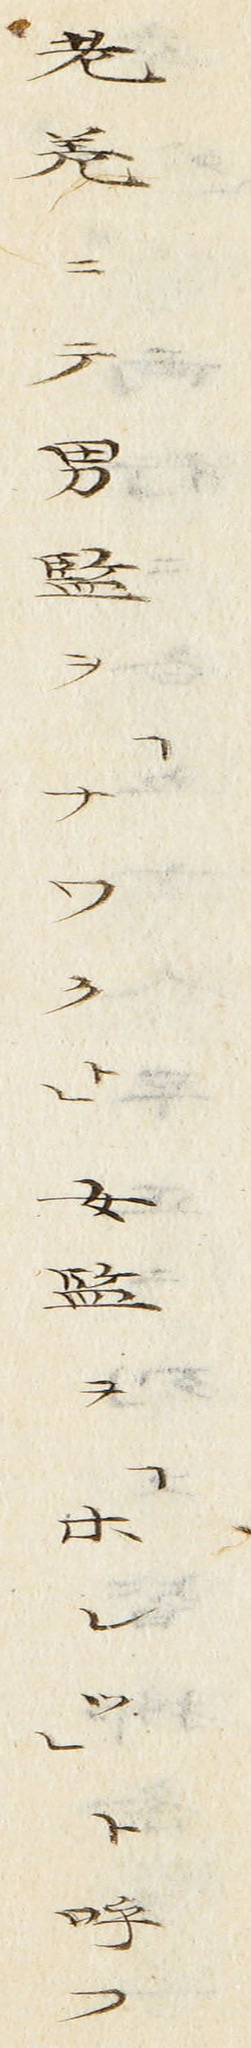〇老羗ニテ男監ヲ「ナワクト」女監ヲ「ホレツ」ト呼フ
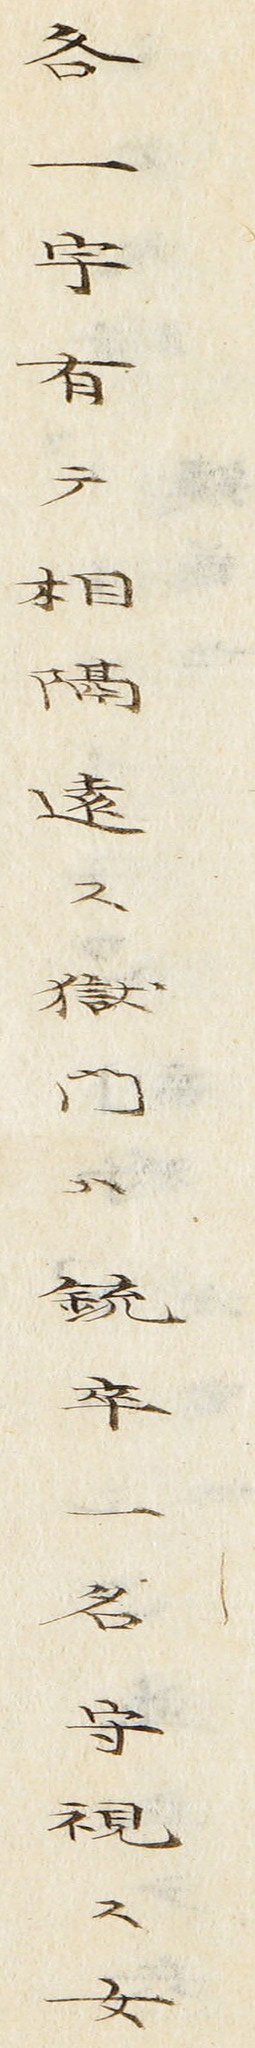各一宇有テ相隔遠ス獄門ハ銃卒一名守視ス女
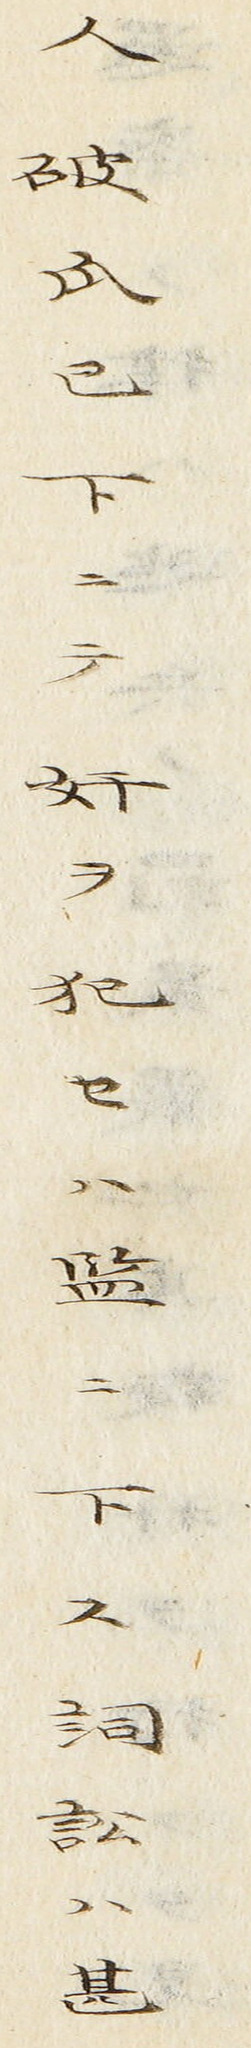人破瓜已下ニテ奸ヲ犯セハ監ニ下ス詞訟ハ甚
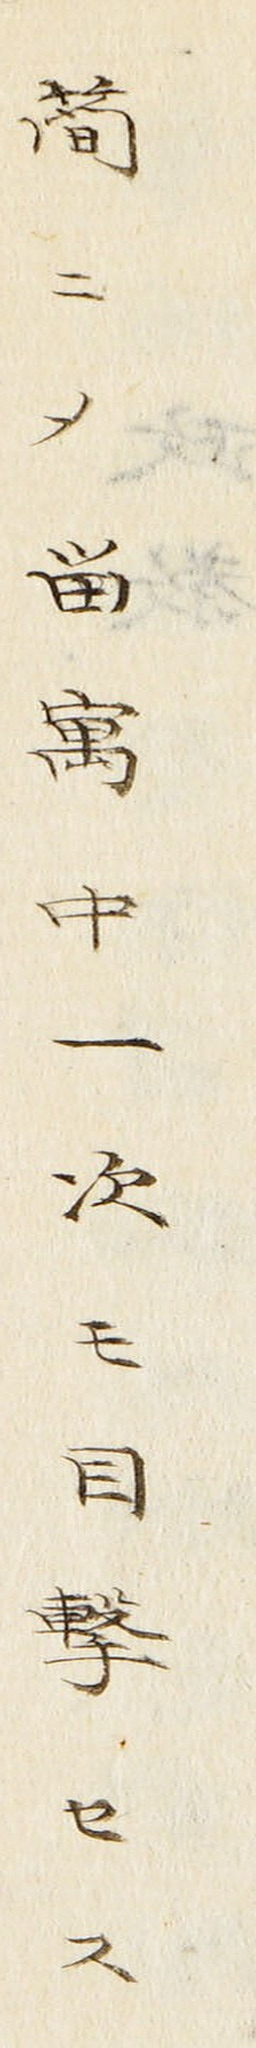簡ニシテ留寓中一次モ目撃セス
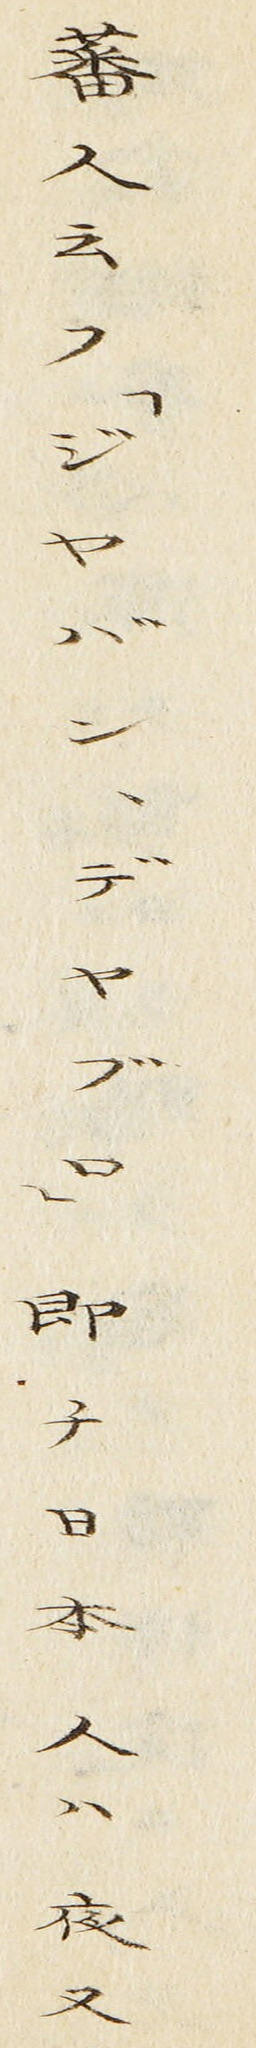〇蕃人云フ「ジヤバン、デヤブロ」即チ日本人ハ夜又
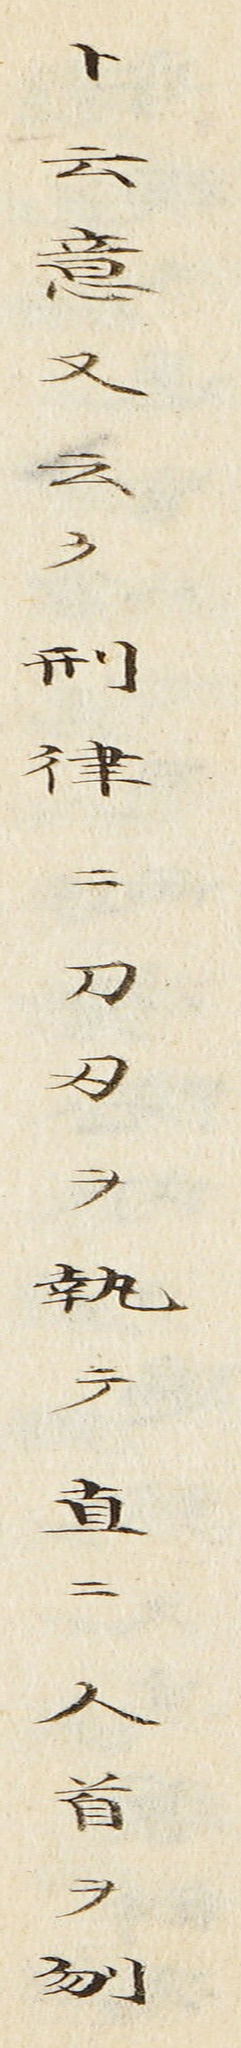ト云意又云ク刑律ニ刀刃ヲ執テ直ニ人首ヲ刎
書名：蕃談
